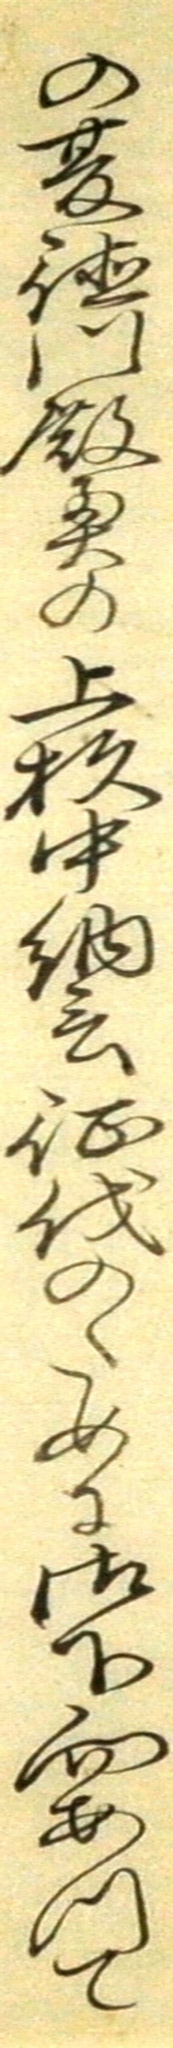の夏徳川殿奥の上杉中納言征伐のために御下向あつて
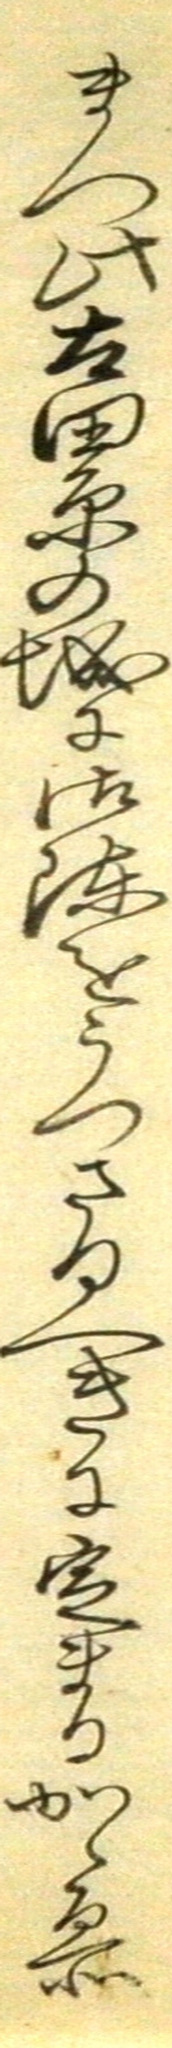まつ此太田原の城に御陣をうつさるへきに定まるかゝる所
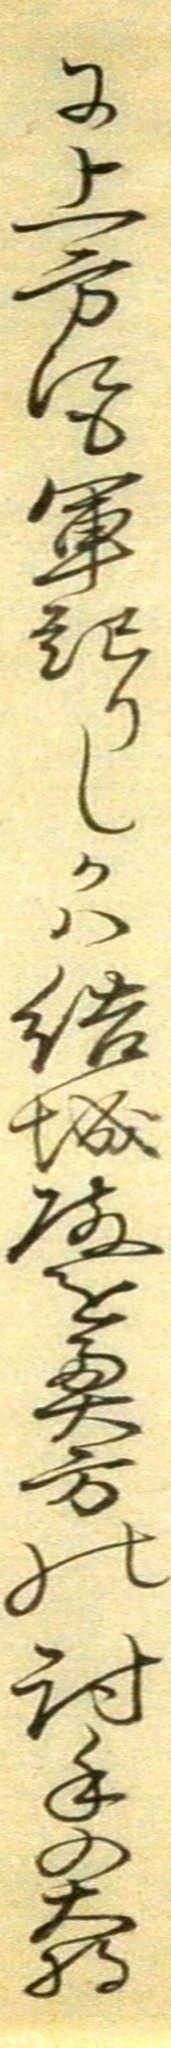に上方にも軍起りしかは結城殿を奥方の討手の大将
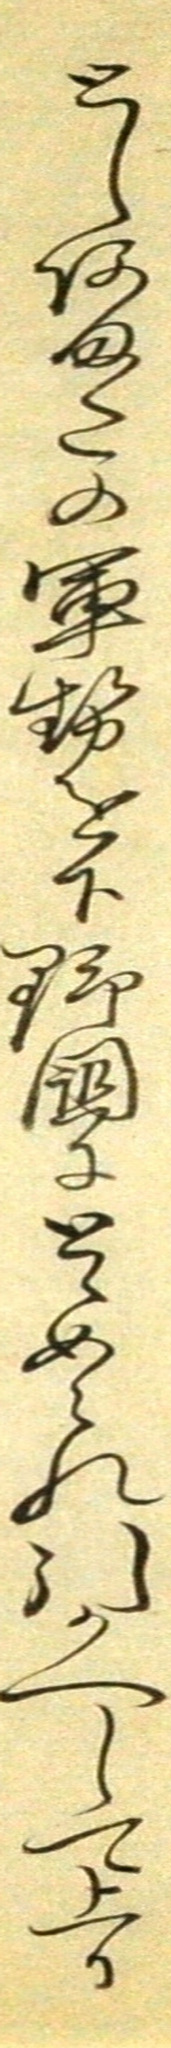としあまたの軍勢を下野国にとゝめられ引かへして上り
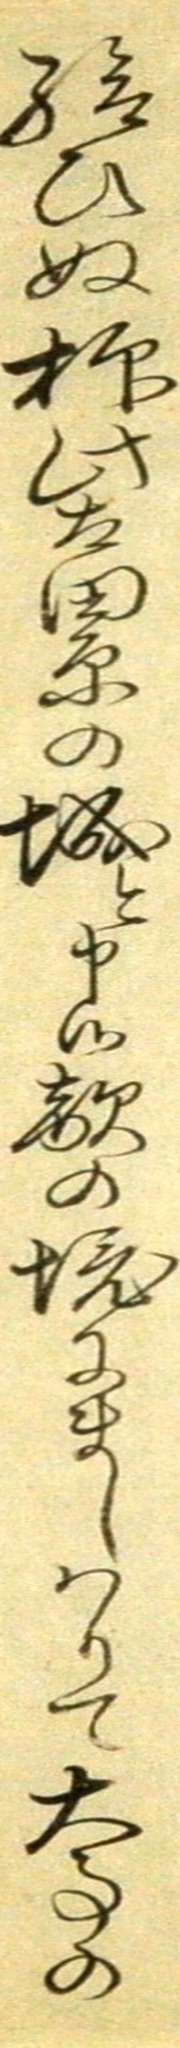給ひぬ抑此太田原の城と申候敵の境にましはりて大事の
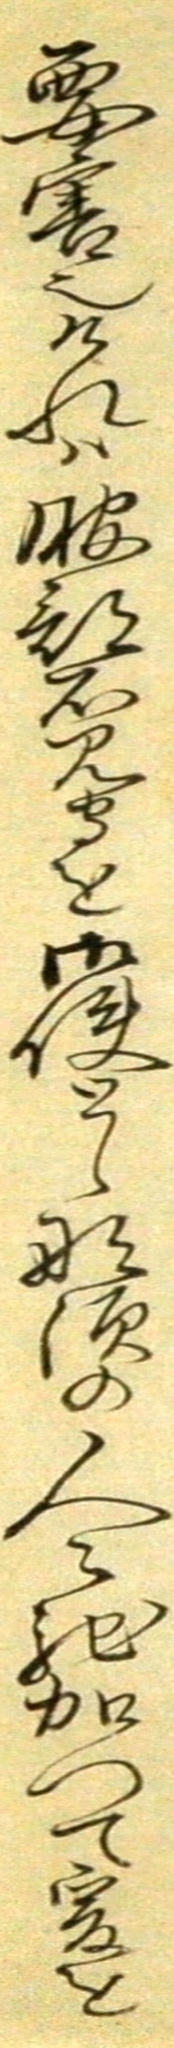要害也けれは服部石見守を御使とし那須の人々馳加つて爰を
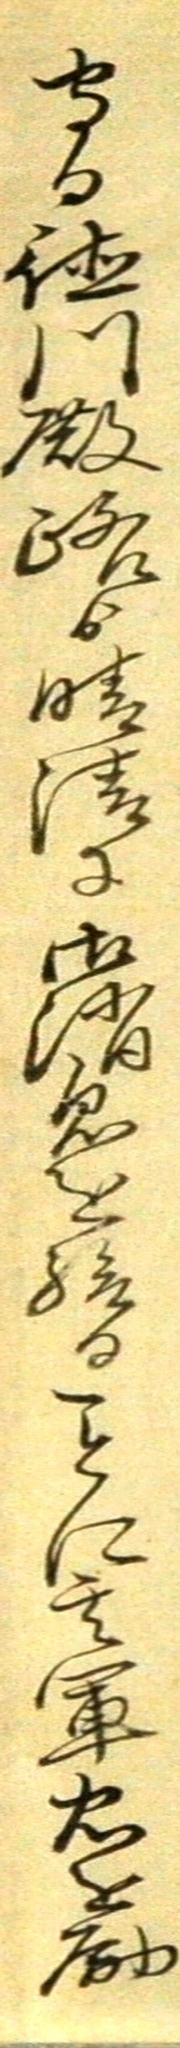守る徳川殿路より晴清に御消息を給ることに其軍忠を励

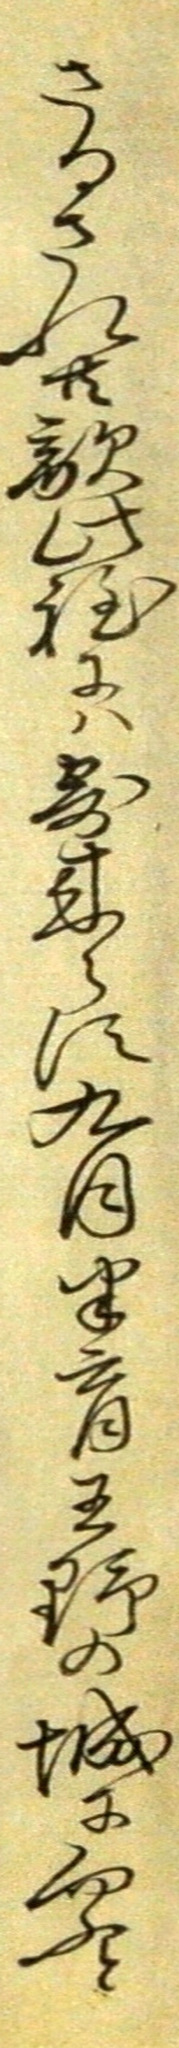さるされ共敵此程には寄来らす九月半育王野の城に向ふと
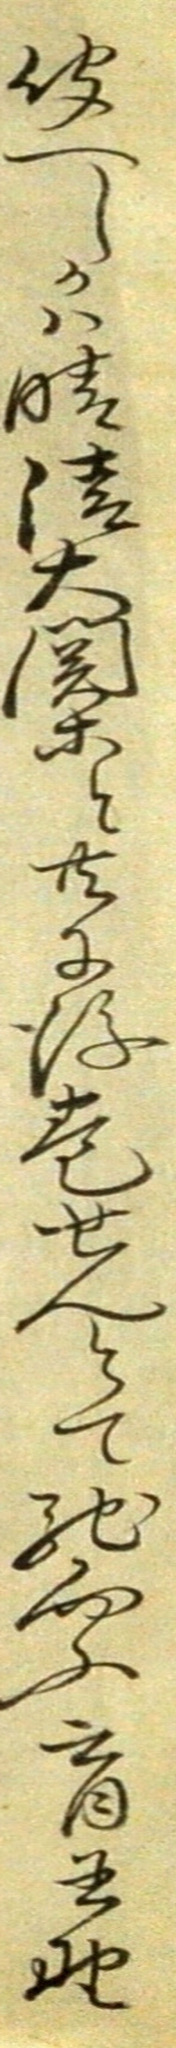聞へしかは晴清大関等と共に後巻せんとて馳向ふ育王野
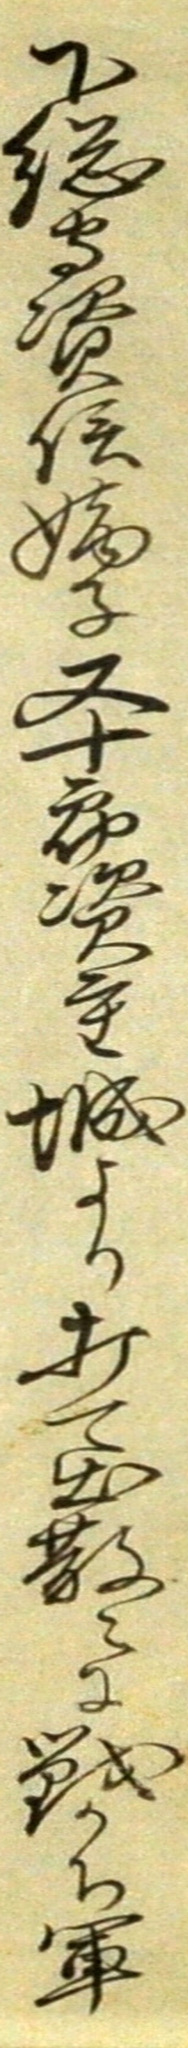下総守資信嫡子又十郎資重城より打て出散々に戦かち軍
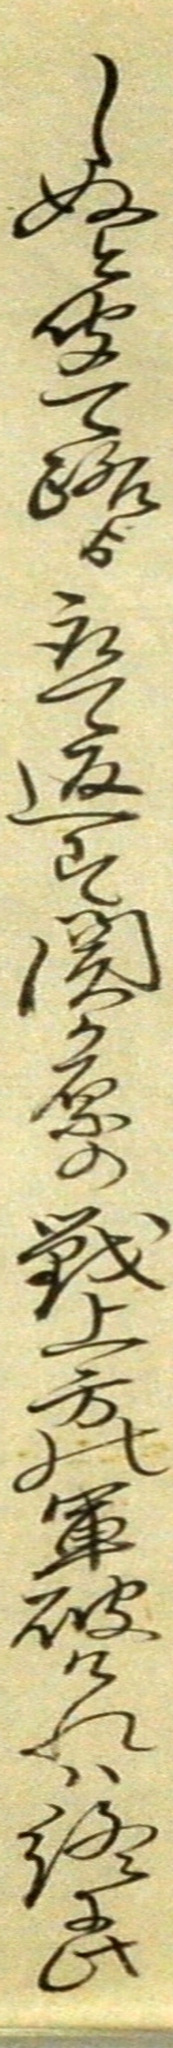しぬと聞て路より取て返す関か原の戦上方の軍破けれは終に此
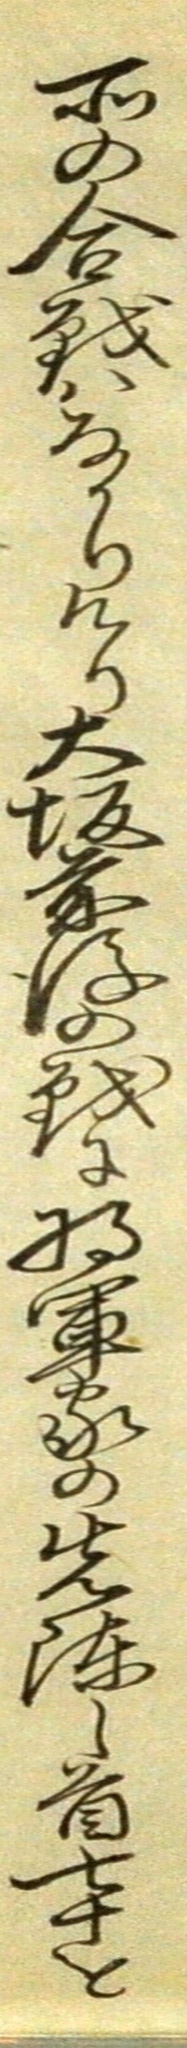所の合戦はなかりけり大坂前後の戦に将軍家の先陣し首七十を
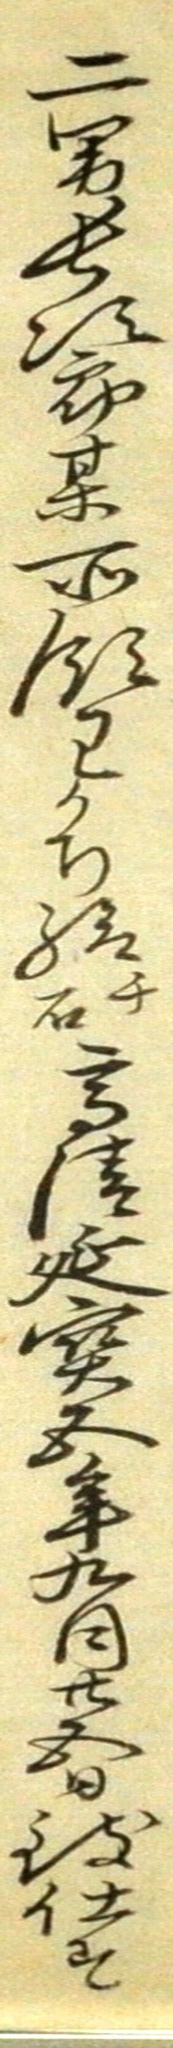二男長次郎某所領わかち給千石高清延宝五年九月廿五日致仕す
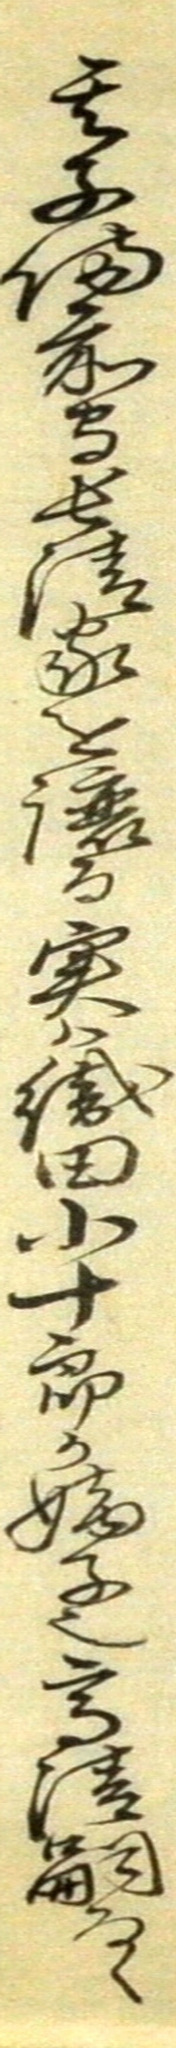其子備前守長清家を譲る実は織田小十郎か嫡子也高清嗣なく
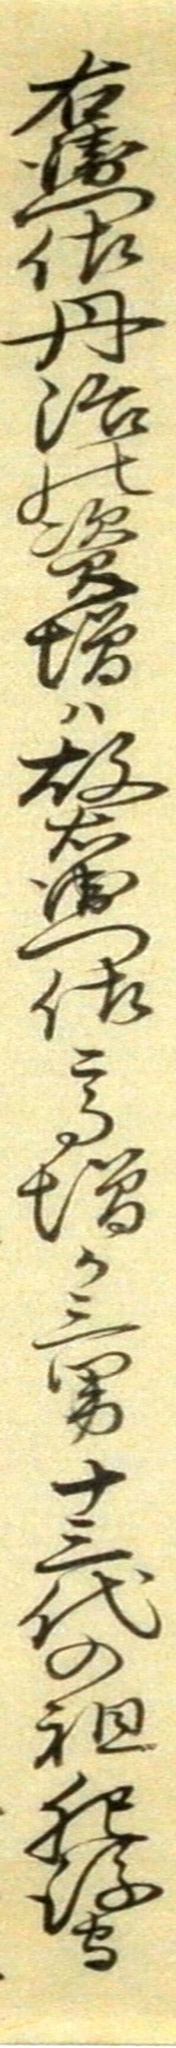右衛門佐丹治の資増は故右衛門佐高増か三男十三代の祖肥後守
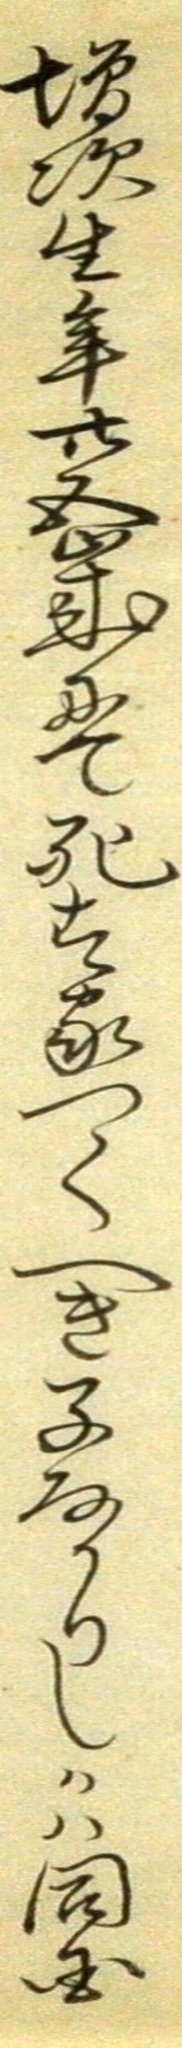増次生年廿五歳にて死す家つくへき子なかりしかは同国
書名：藩翰譜（九・下）
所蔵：伊那市立高遠町図書館・合同会社AMANE
